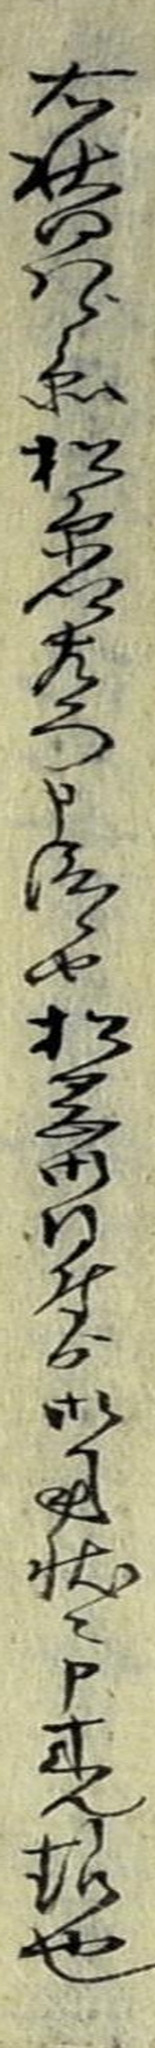右秋田八郎兵衛松原郷左衛門申渡候由松岡御目付ゟ御用状ニ申来ル趣也
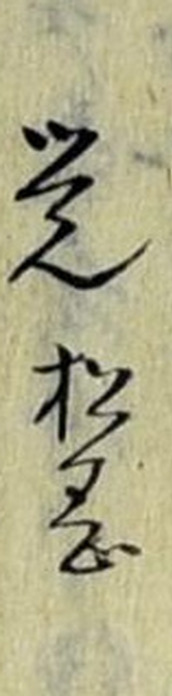覚松岡
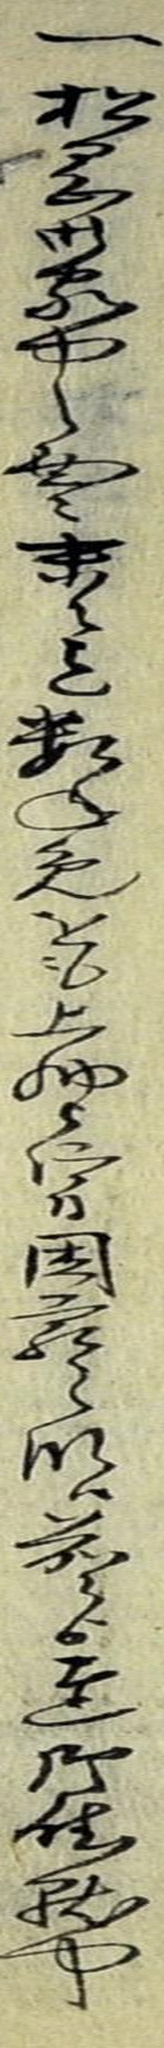一松岡御家中面々末々迄数年免をも上納被仰付困窮之段ハ前々ゟ達御聴就中
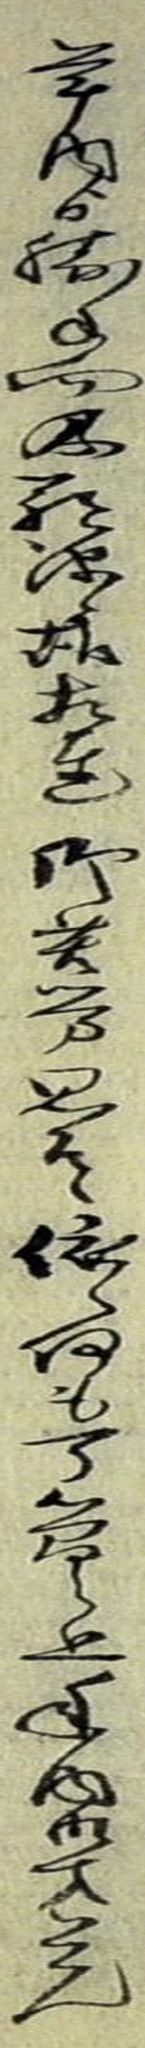年内ゟ勝手向及難儀候趣相達御苦労思召候依之何も了簡之上年内御才覚
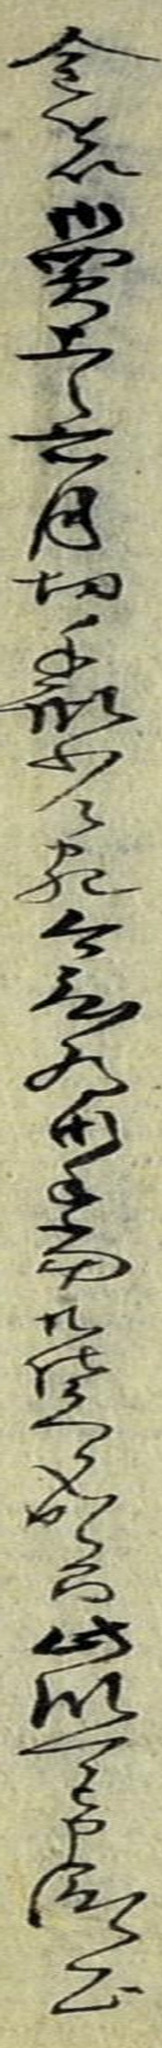金を以御買上之六月切手形少々宛今度為御手当御貸被成候間此段可被申渡候以上
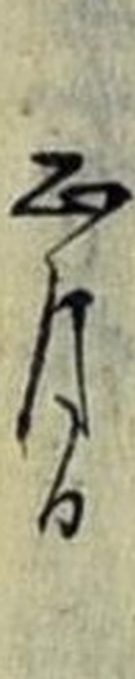正月日
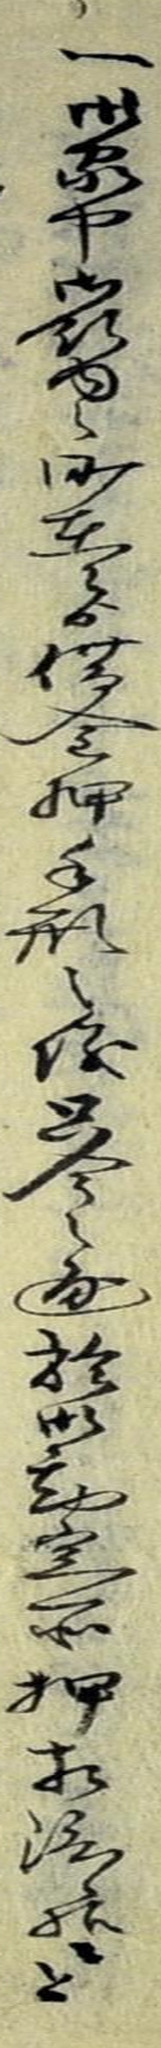一御家中御領内之町在々ゟ借金押手形之儀只今之通於御勘定所押相渡候様ニと
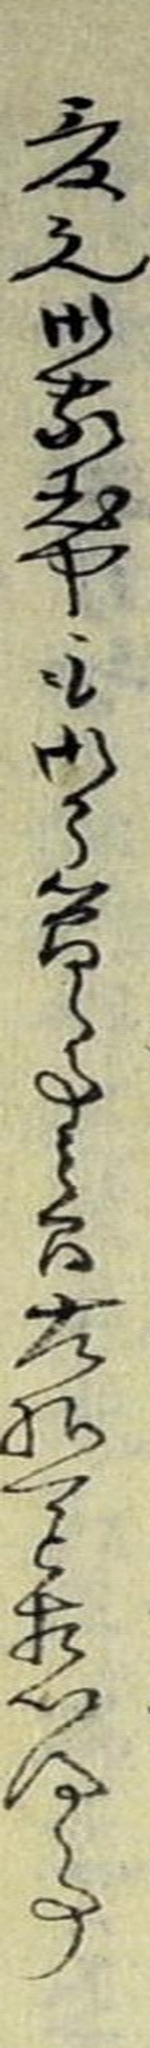爰元御家老中へも御了簡候事ニ候間左様可相心得事
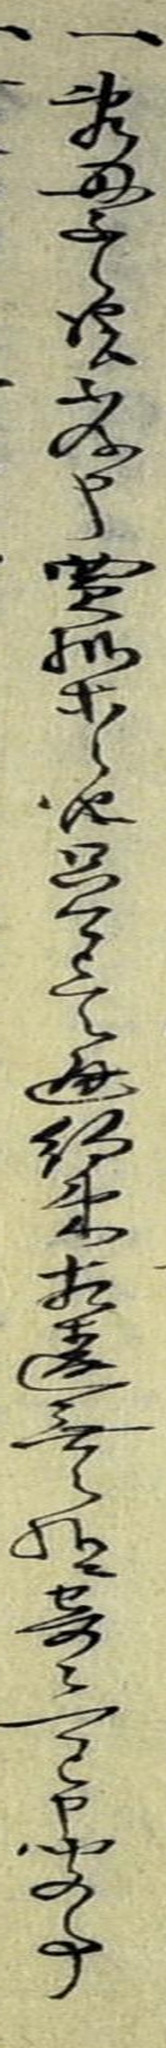一頼母子之儀ハ不及申買掛等之儀只今迄之通約束相違無之様ニ寄々可被申聞事
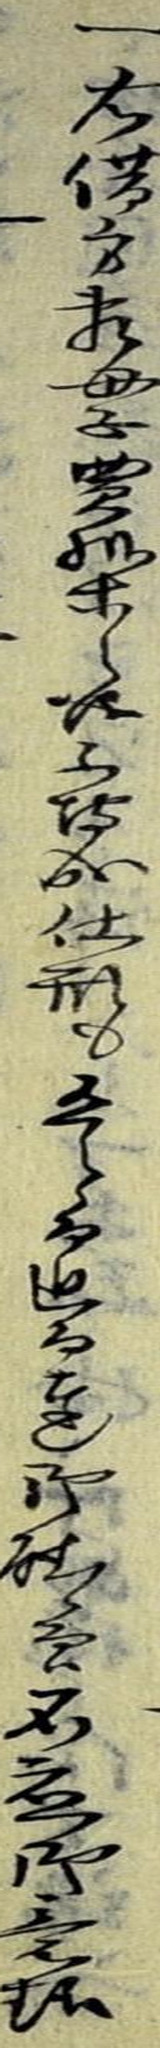一右借方頼母子買掛等之儀不埒成仕形も有之候而追而達御聴候而ハ不応御意趣
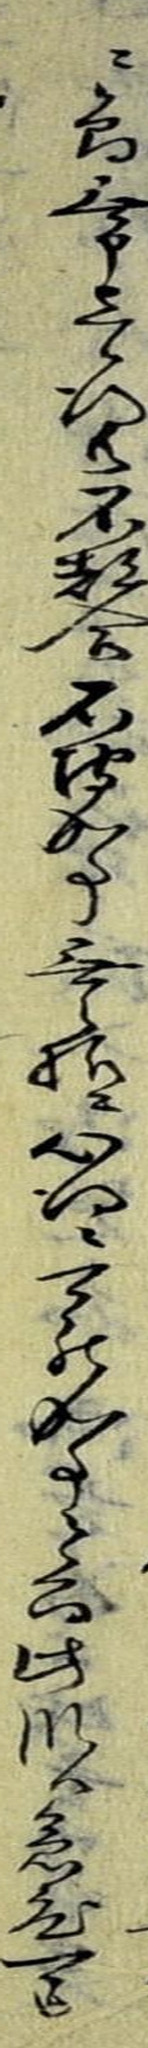ニ候間無申上候得共不都合不埒成事無之様ニ心得ニ可被成事ニ候間此段ハ急度可被
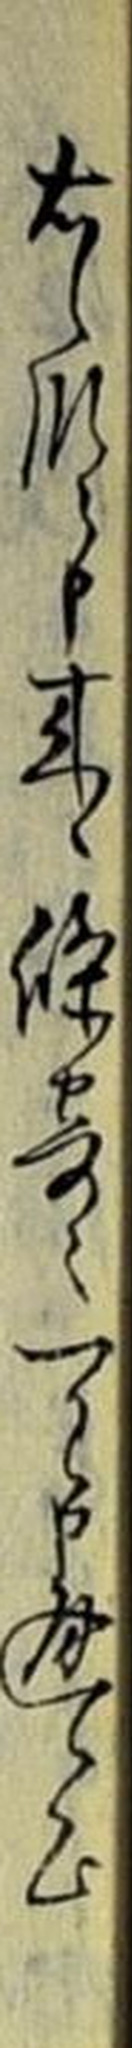右之段々申来候条寄々可被申通候以上
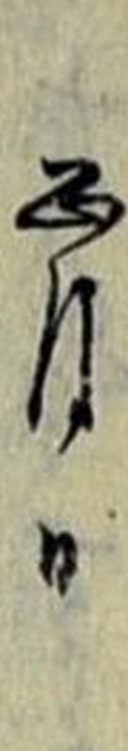正月日
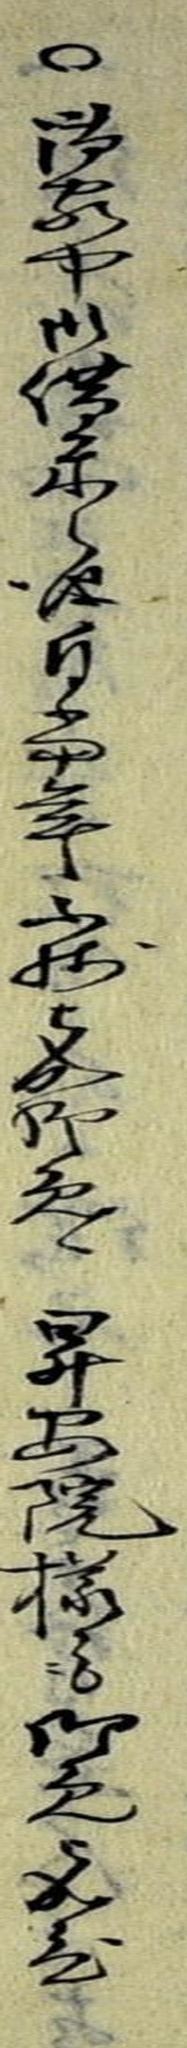〇御家中御借米之儀自当年不残被成御免候昇安院様ニも御免被成度
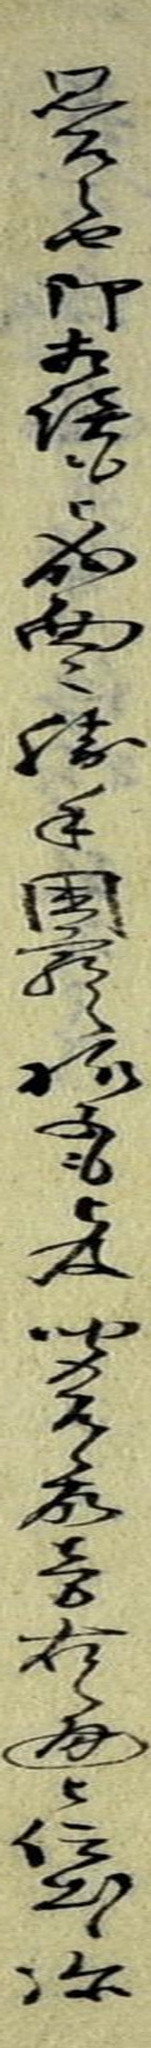思召之由御相談も被成面々勝手困窮之様子も被及聞召候故旁右之通被仰出候弥
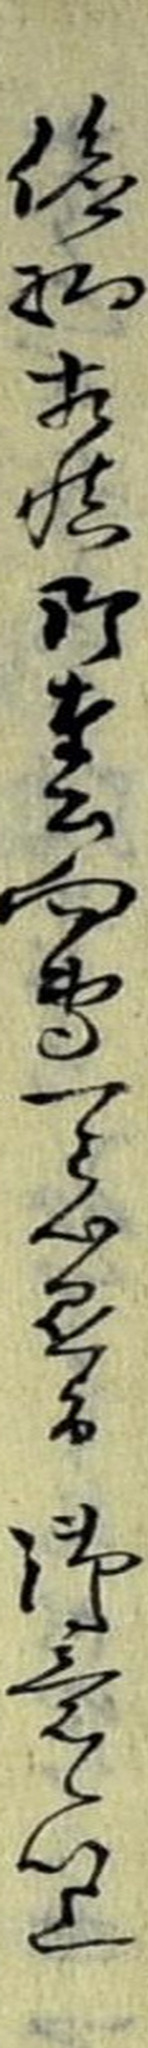倹約相慎御奉公向専可被心懸旨御意候以上
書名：命令之部 一
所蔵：福井県文書館 Fukui Prefectural Archives
